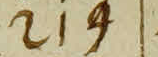219
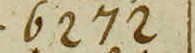6272
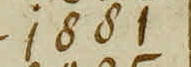1881
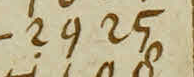2925
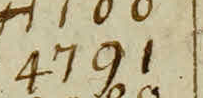4791
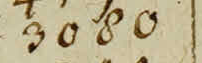3080
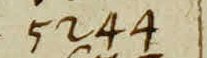5244
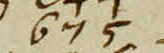675
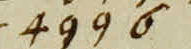4996
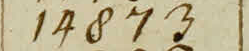14873
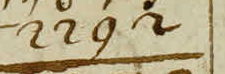2292
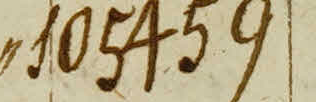105459
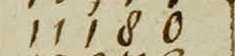11180
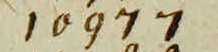10977
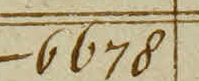6678
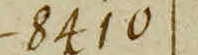8410
